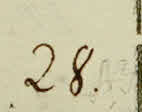28.
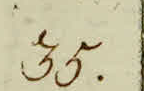35.
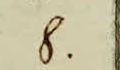8.
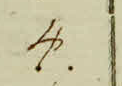4.
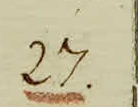27.
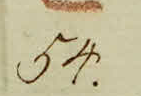54.
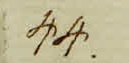44.
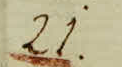21.
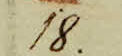18.
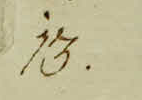13.
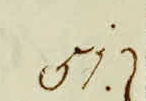51.
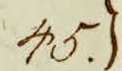45.
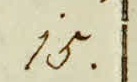15.
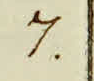7.
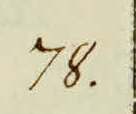78.
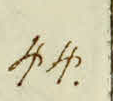44.
